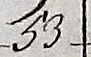53
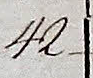42
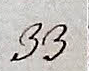33
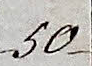50
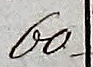60
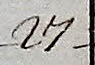27
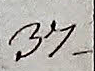37
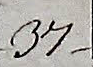37
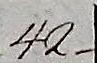42
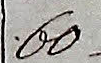60
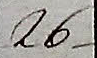26
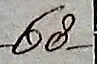68
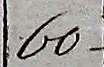60
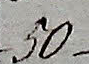50
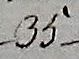35
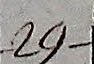29
